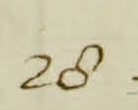28
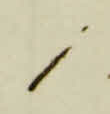1
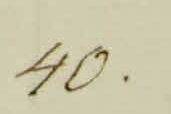40.
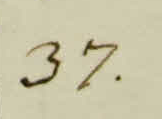37.
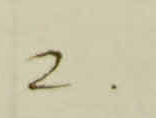2.
